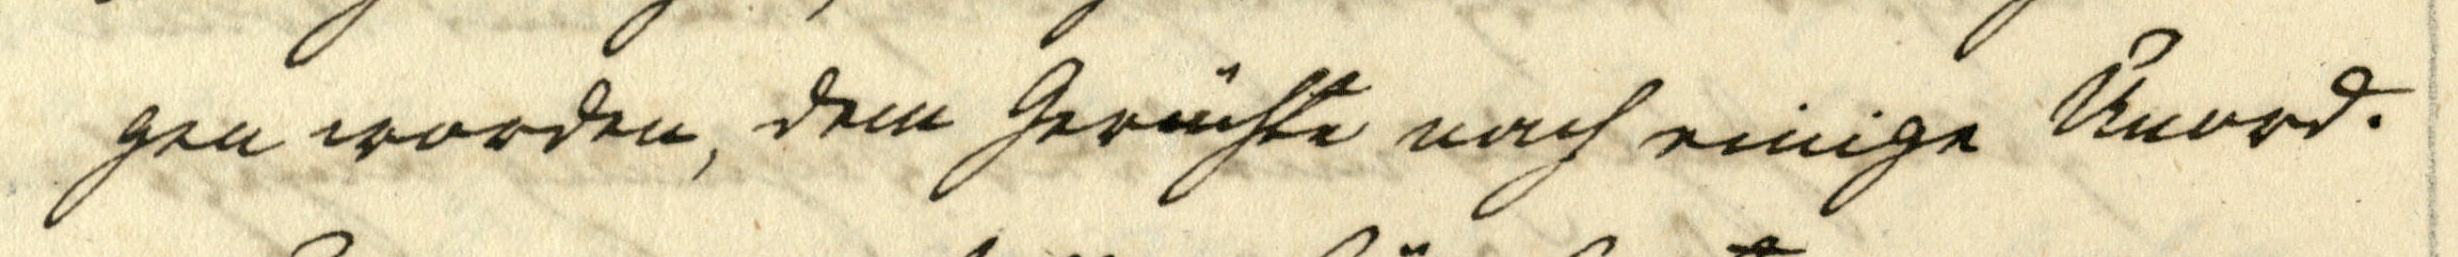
gen worden, dem Gerüchte nach einige Unord¬
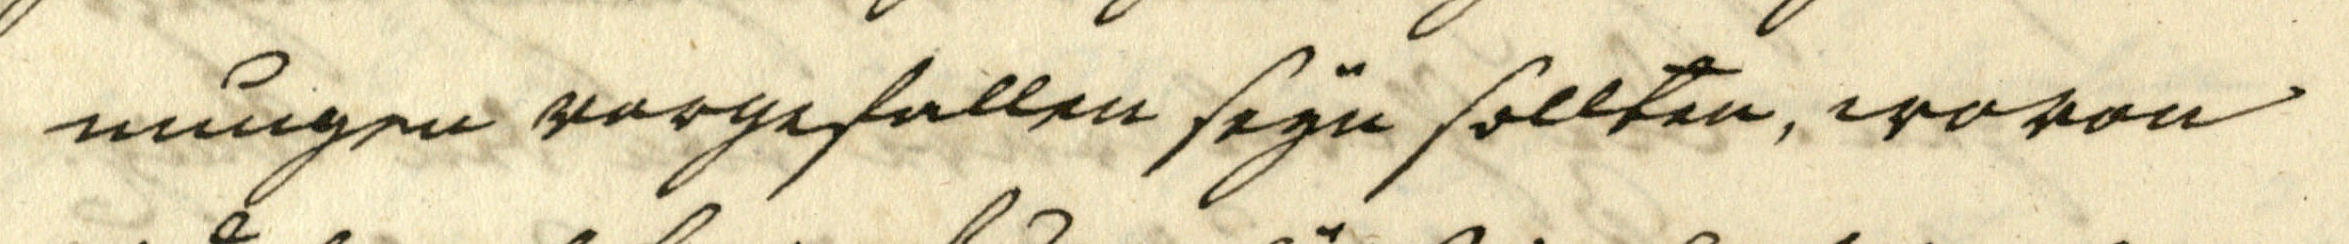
nungen vorgefallen seÿn sollten, wovon
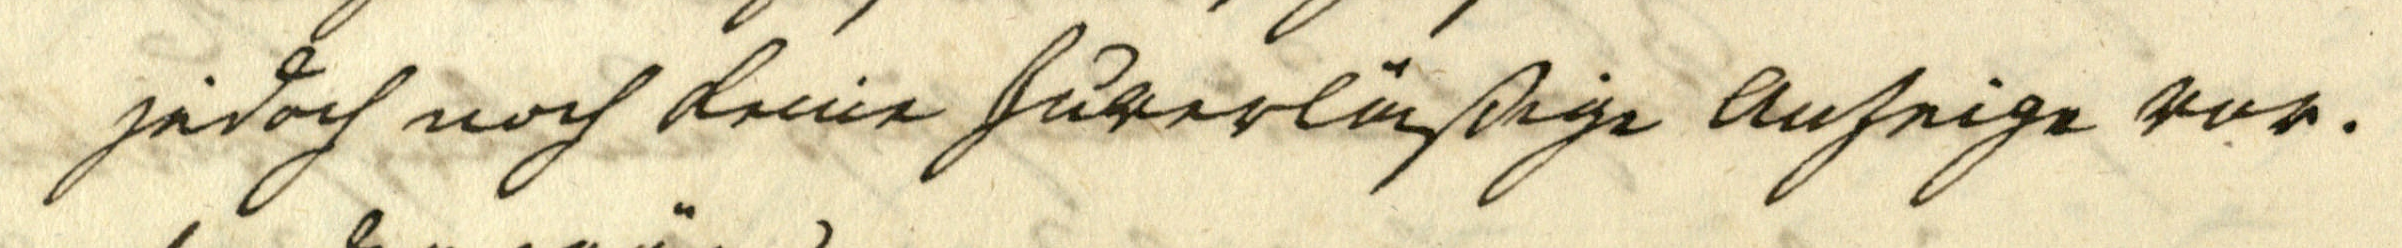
jedoch noch keine zuverläßige Anzeige vor¬
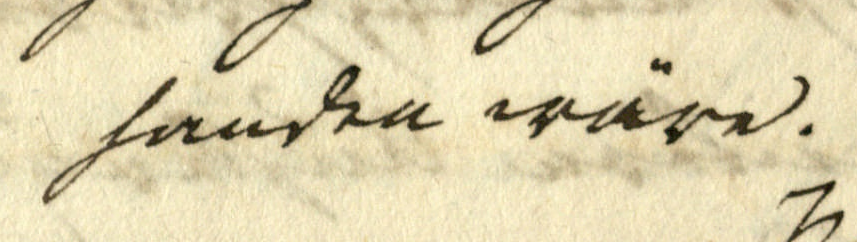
hafänden wäre.
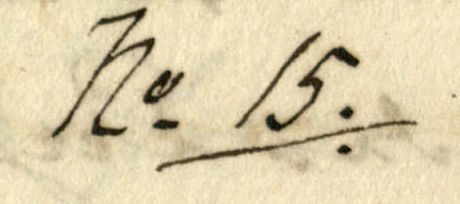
No 15.
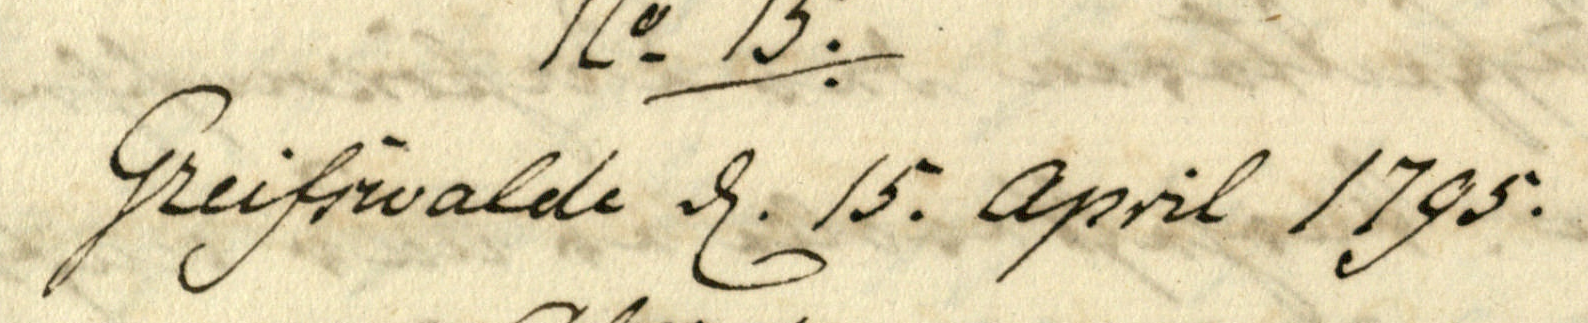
Greifswalde d. 15. April 1795.
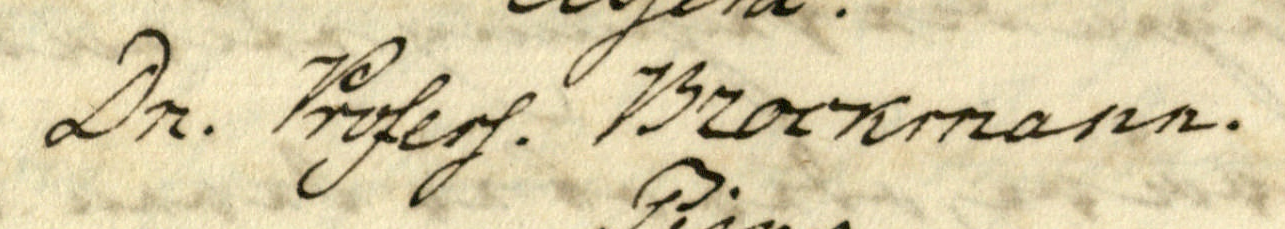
Dn. Profess. Brockmann.
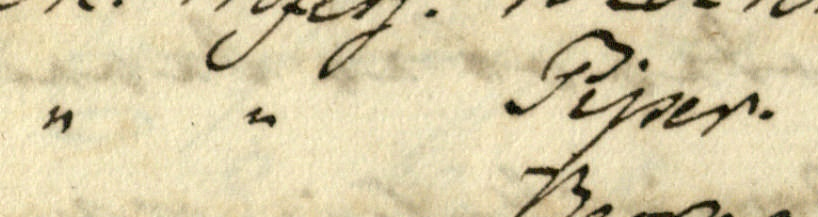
Piper.
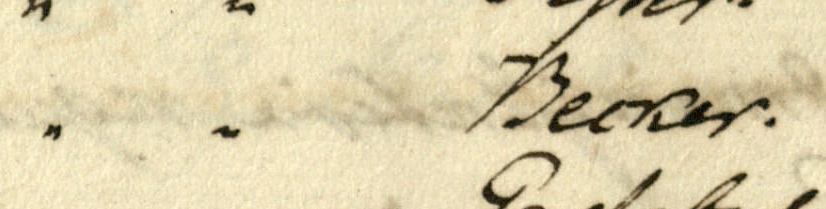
Becker.
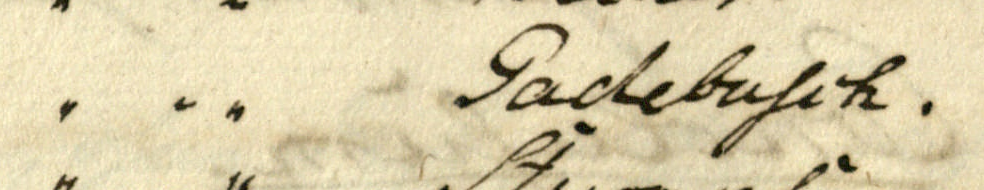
Gadebusch.
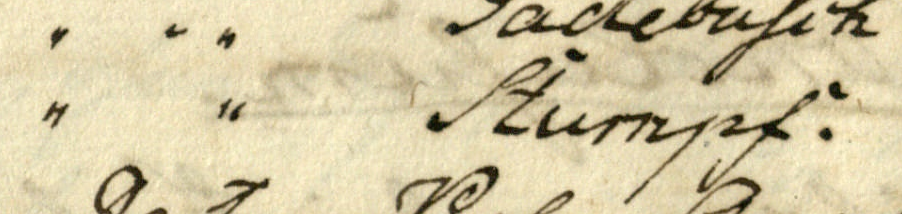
Stumpf.
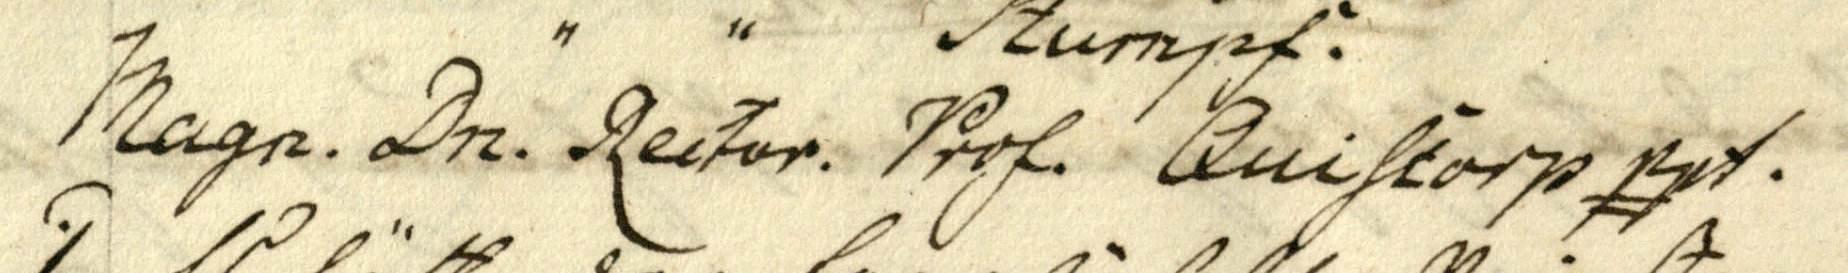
Magn. Dn. Rector. Prof. Quistorp ppt.
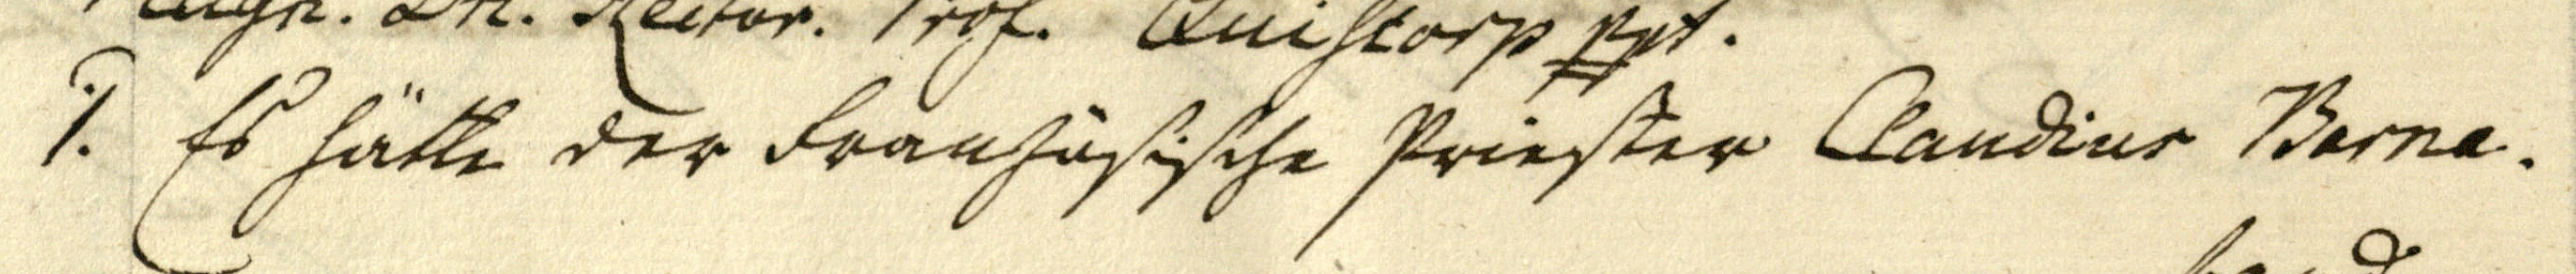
1. Es hätte der Französische Priester Claudius Barna¬
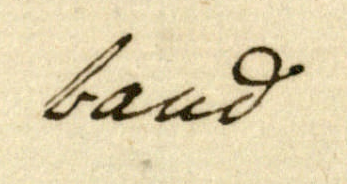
band
